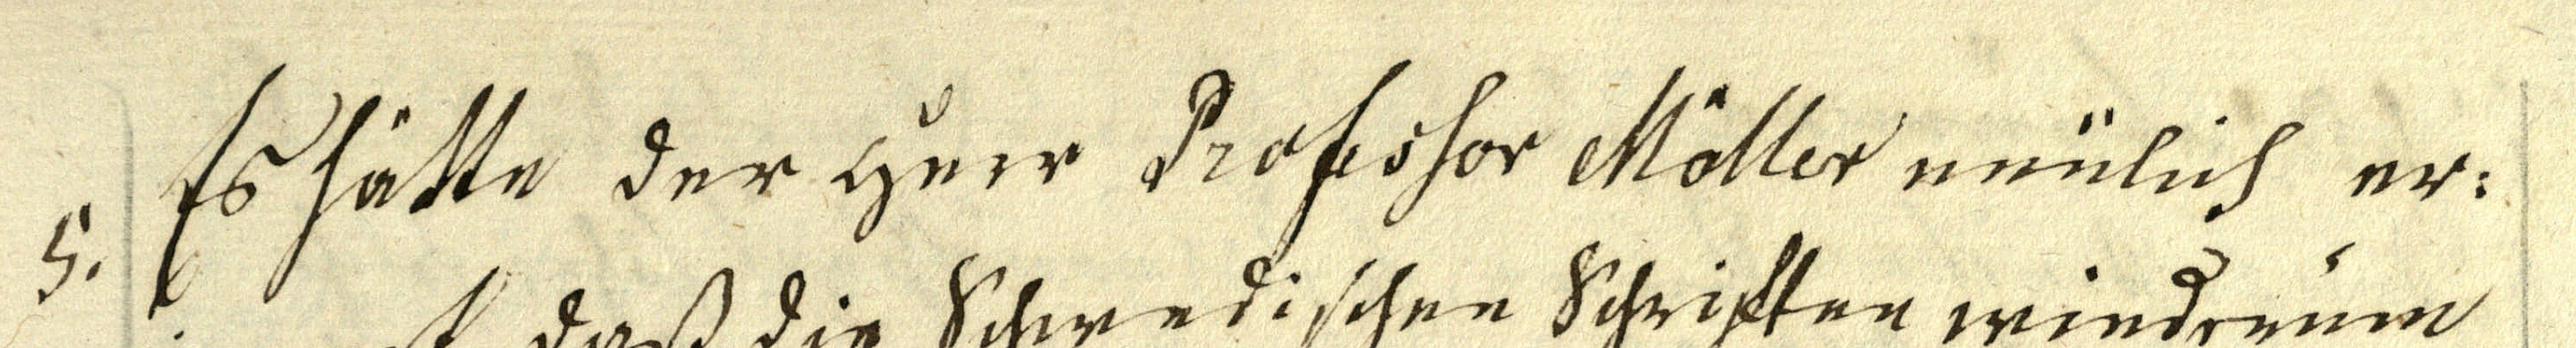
5. Es hätte der Herr Professor Möller neulich er¬
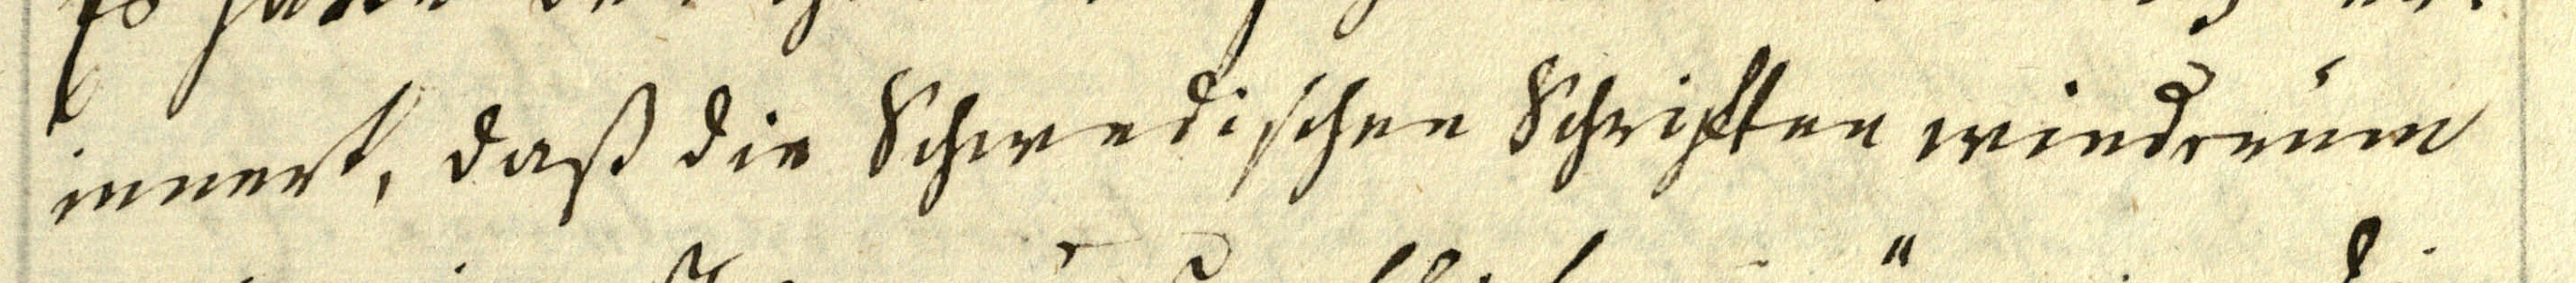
innert, daß die Schwedischen Schriften wiederum
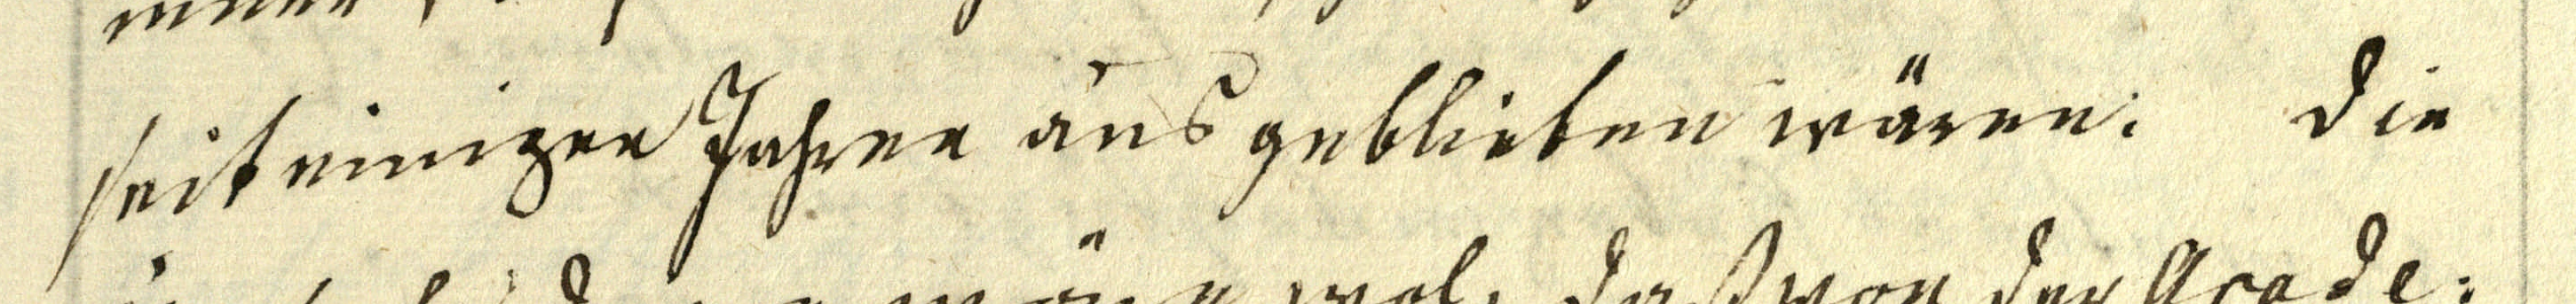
seit einigen Jahren aus geblieben wären. Die
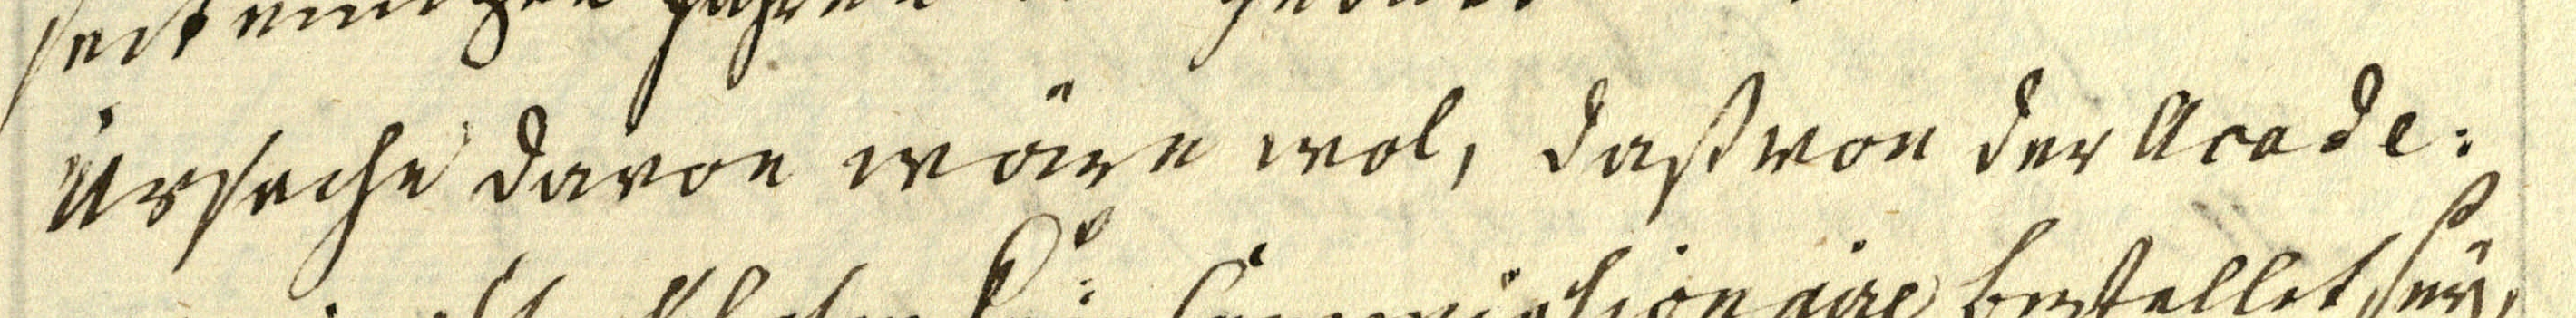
Ursache davon wäre wol, daß von der Acade¬
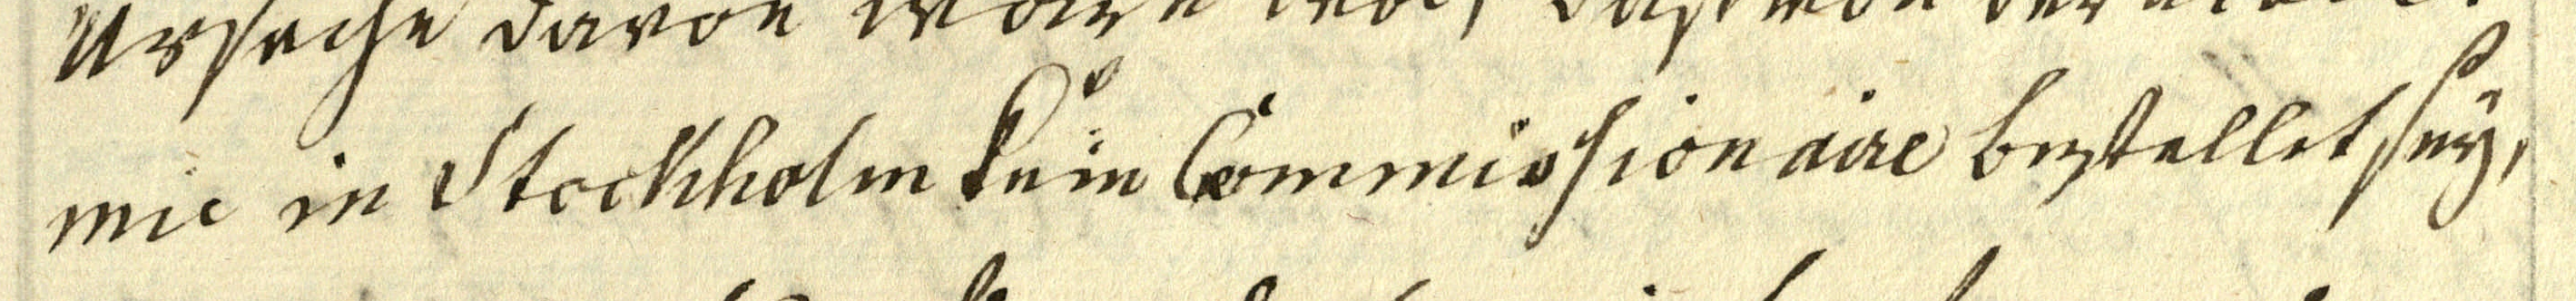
mie in Stockholm kein Commissionaire bestellet seÿ,
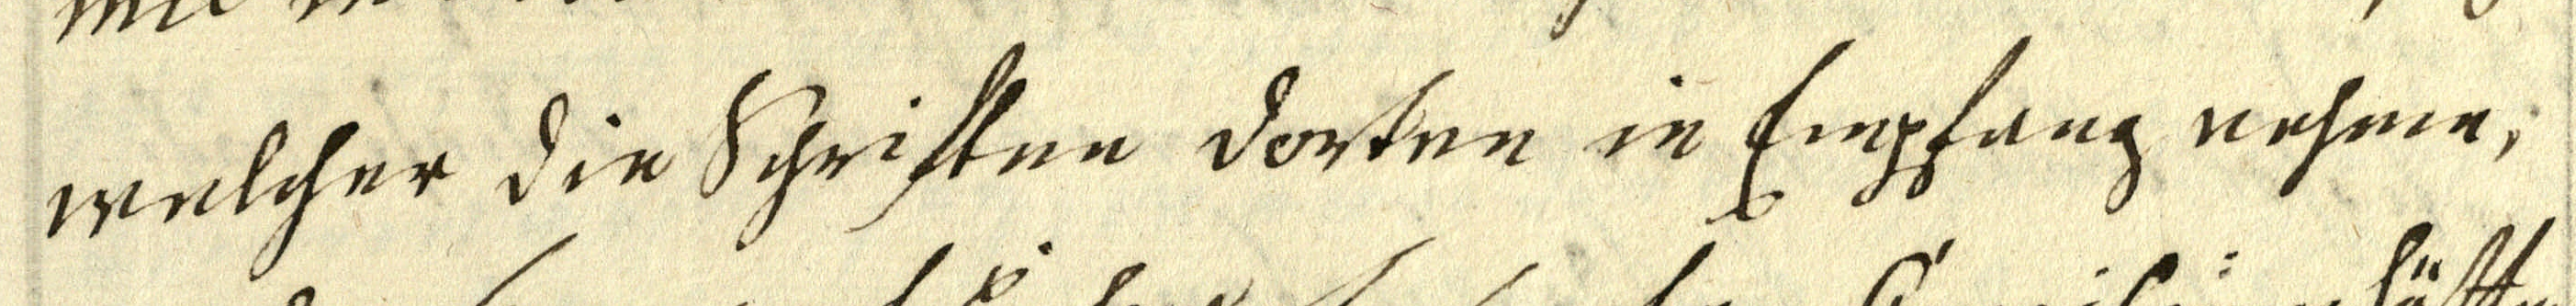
welcher die Schriften dorten in Empfang nehme,
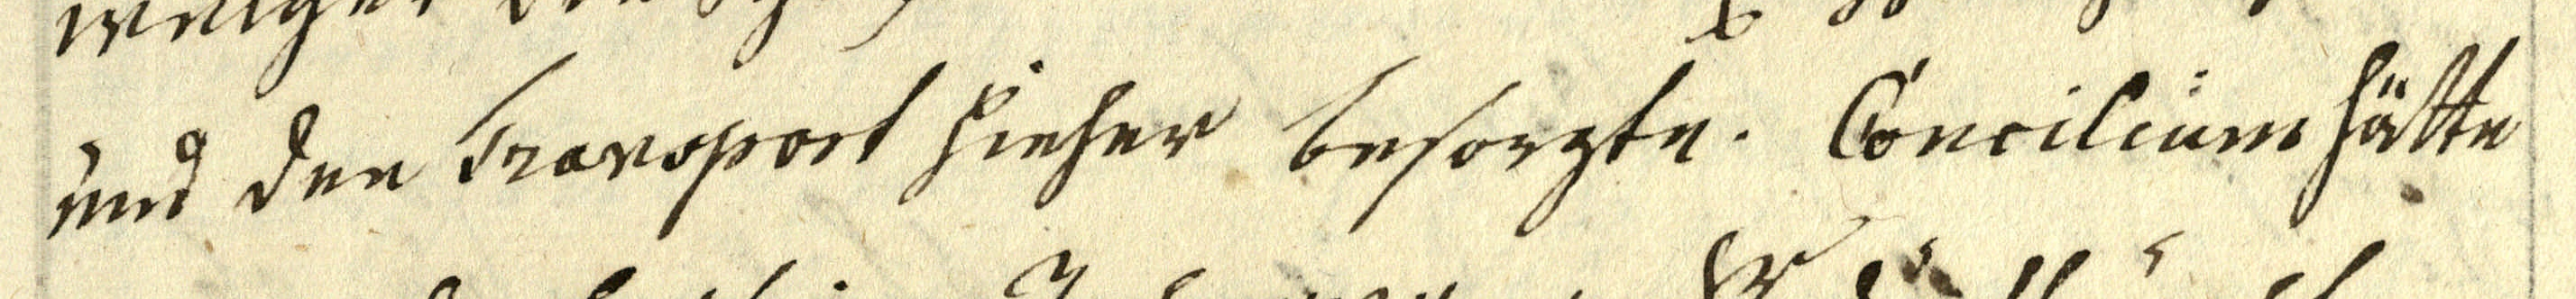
und den Transport hieher besorgte. Concilium hätte
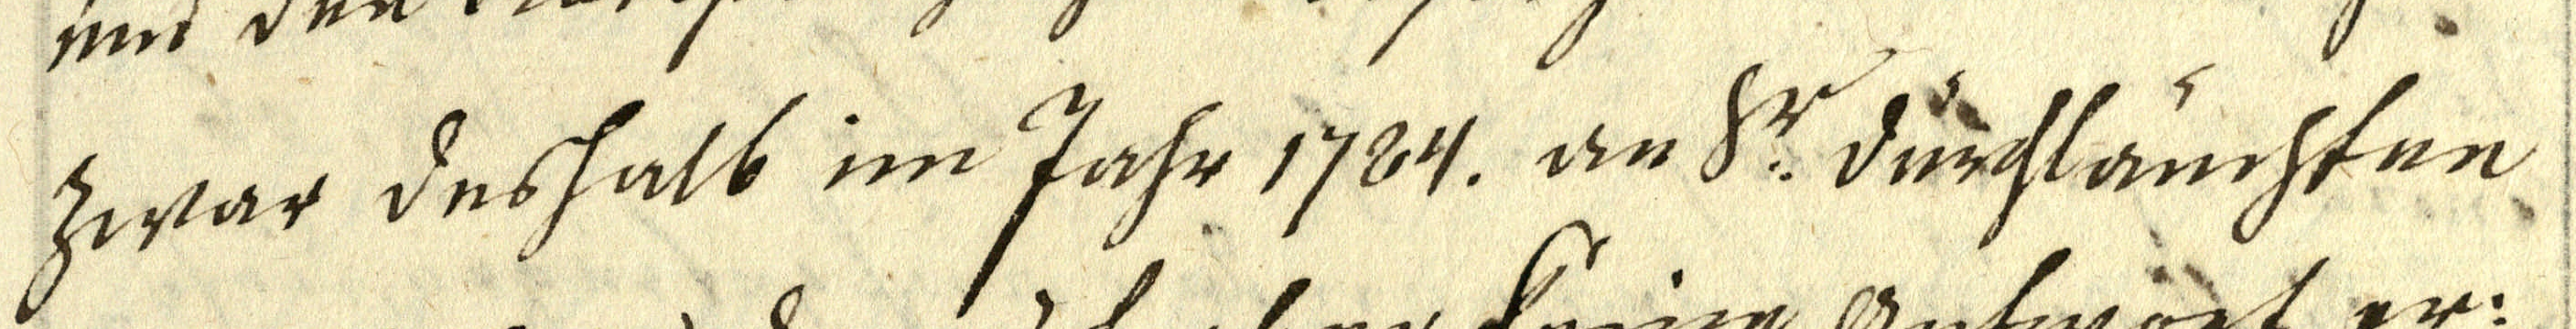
zwar deshalb im Jahr 1784. an Sr. Durchlauchten
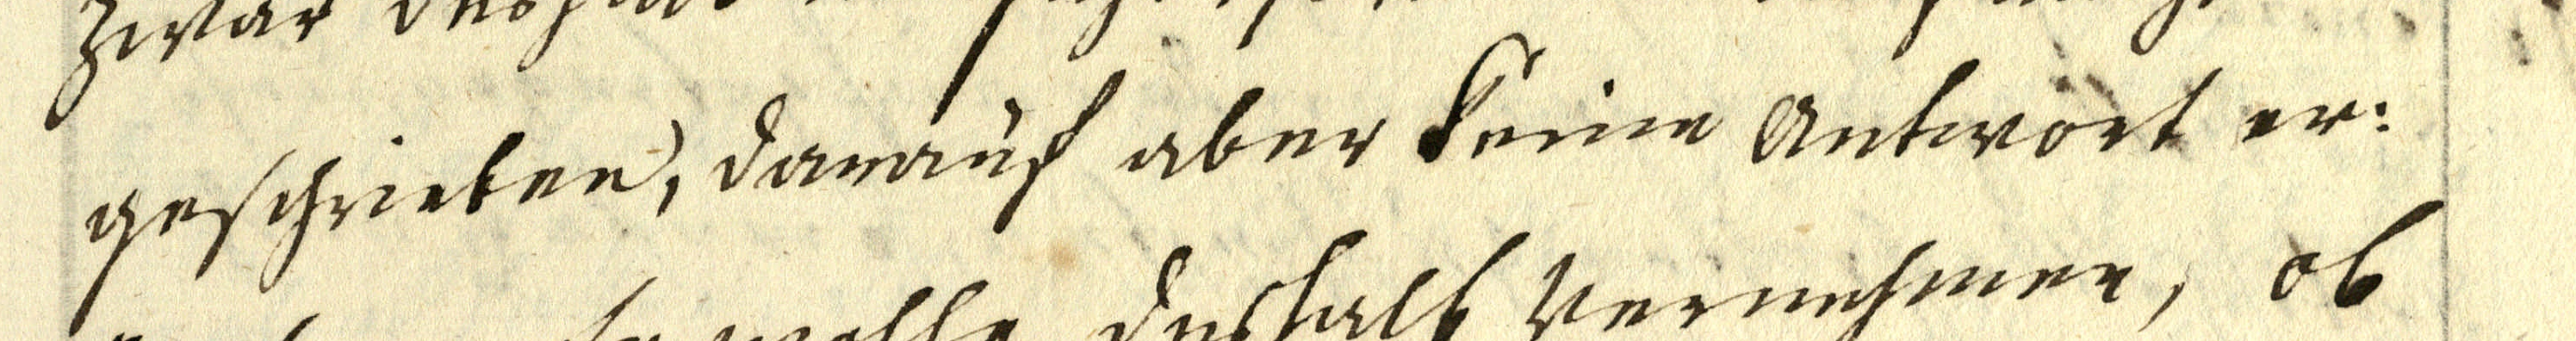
geschrieben, darauf aber keine Antwort er¬
